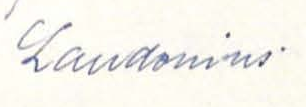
Laudonius
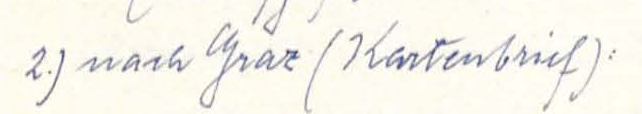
2.) nach Graz (Kartenbrief):
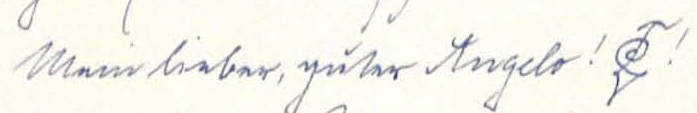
Mein lieberm guter Angelo! CI!
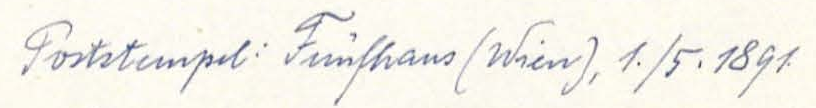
Poststempel: Fünfhaus (Wien), 1. / 5. 1891
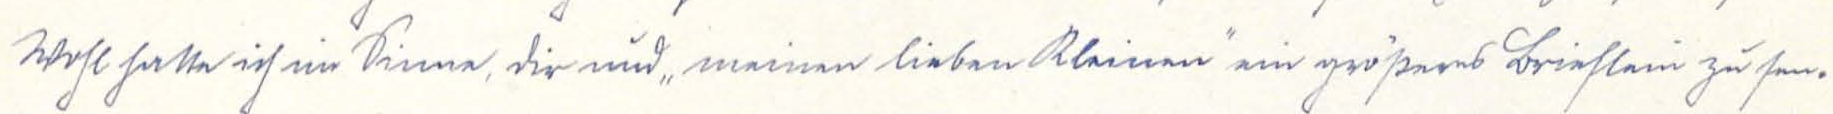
Wohl hatte ich im Sinne, dir und "meinen lieben Kleinern" ein größeres Brieflein zu schre-
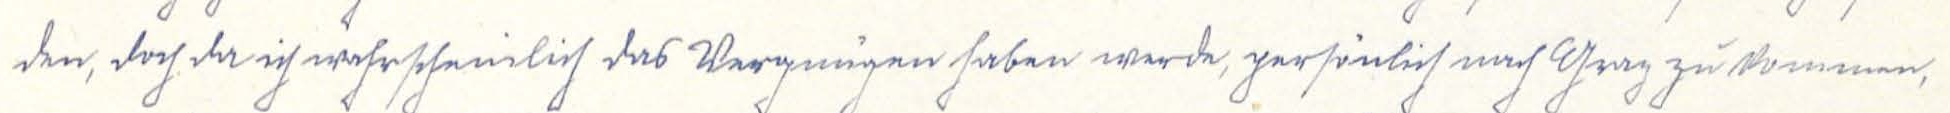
iben, doch da ich wahrscheinlich das Vergnügen haben werde, persönlich nach Graz zu kommen,
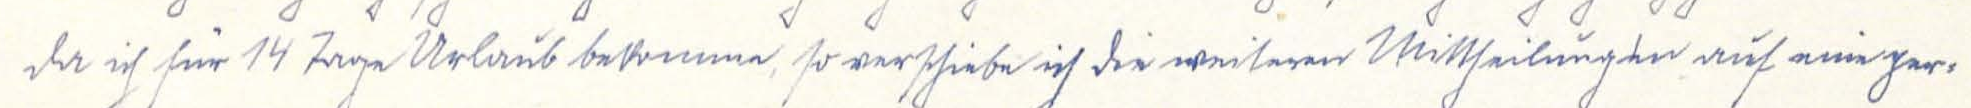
da ich für 14 Tage Urlaub bekomme, so verschiebe ich die weiteren Mittheilungen auf eine per-
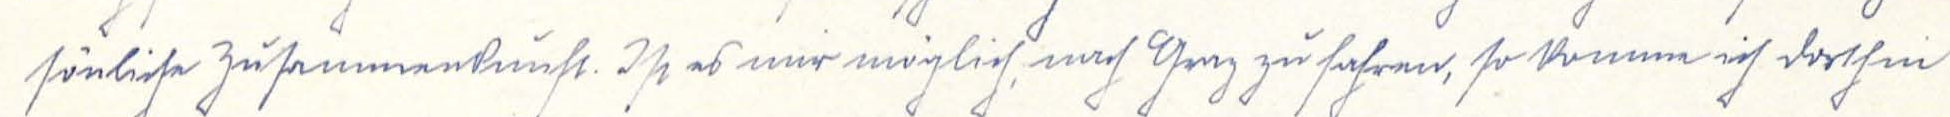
sönliche Zusammenkunft. Ist es mir möglich nach Graz zu fahren, so komme ich dorthin.
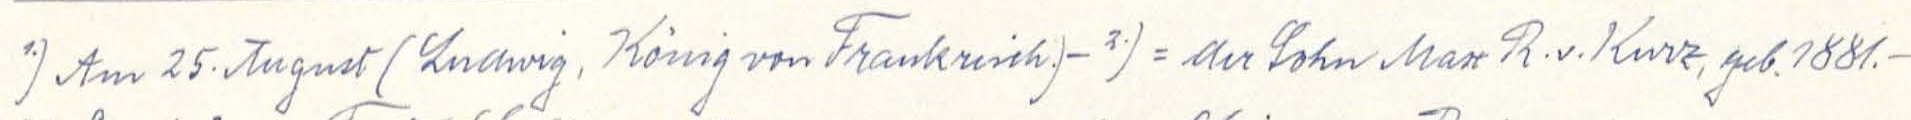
1.) Am 25. August (Ludwig, König von Frankreich.)- 2.) = Der Sohn Max R. von Kurz, geb. 1881.-
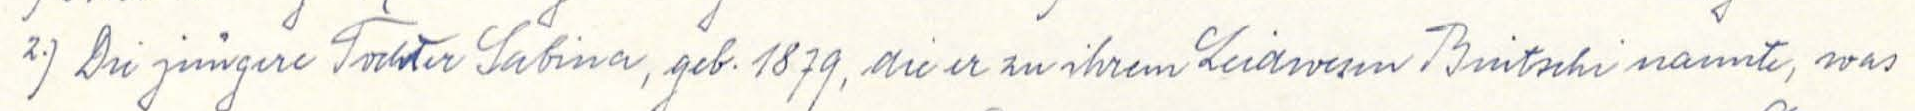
2.) Die jüngere Tochter Sabina, geb. 1879, die er zu ihrem Leidwesen Bnitschi nannte, was
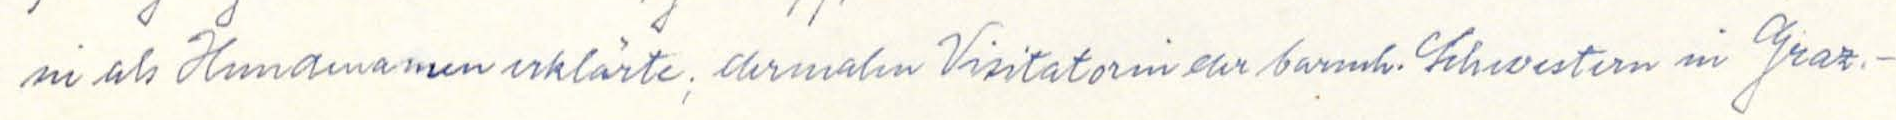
sie als Hundenamen erklärte. Dermalen Visitatorin der barmh. Schwestern in Graz.-
